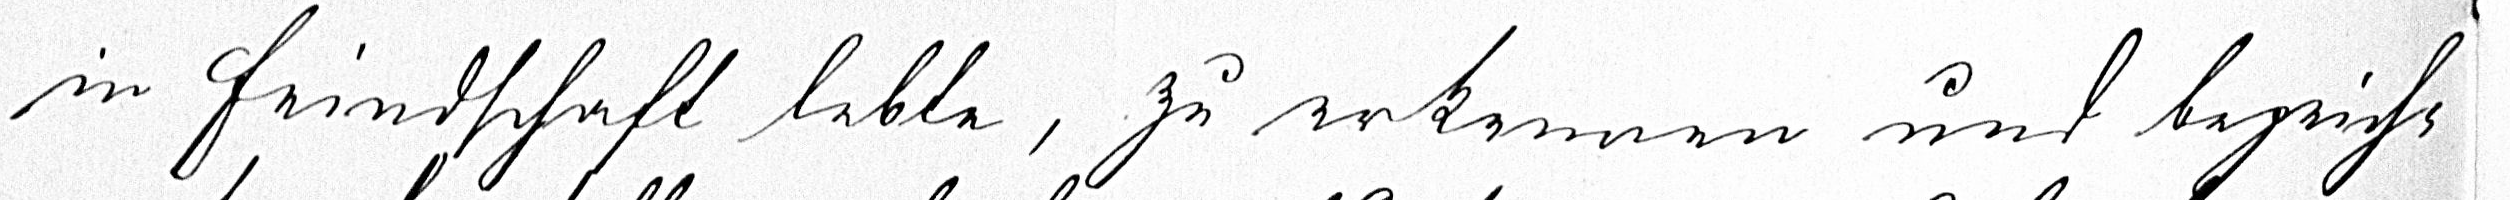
in Feindschaft lebte, zu erkennen und bezeich¬
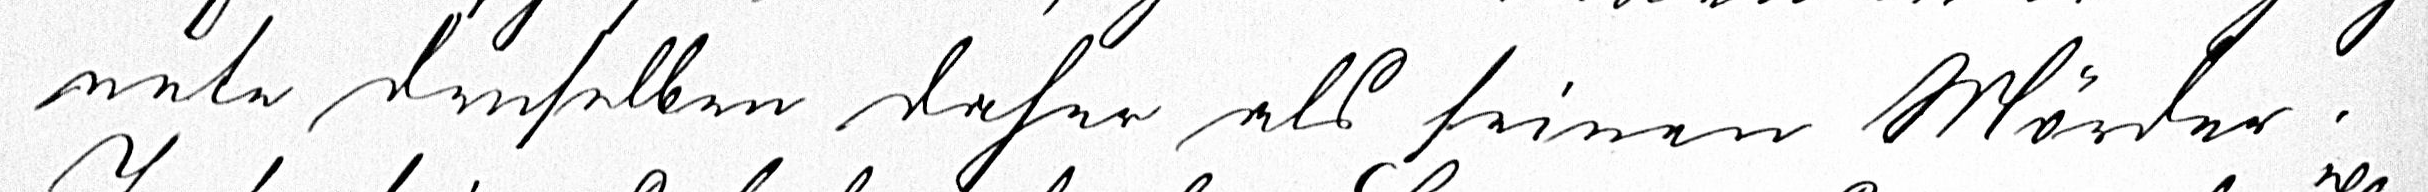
nete denselben daher als seinen Mörder.
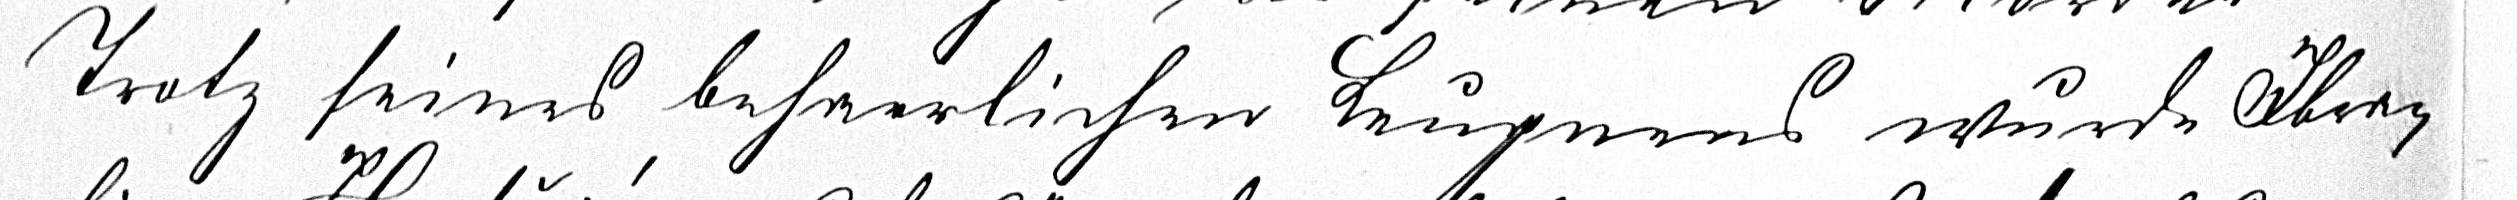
Trotz seines behverlichen Leugnens wurde Ibre¬
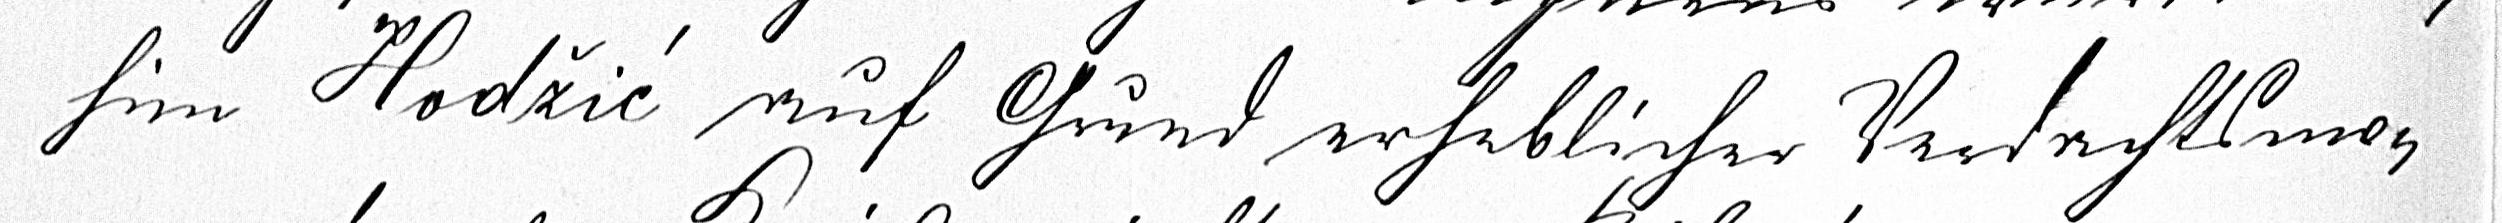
sim Hodzić auf Grund erheblicher Verdachtsmo¬
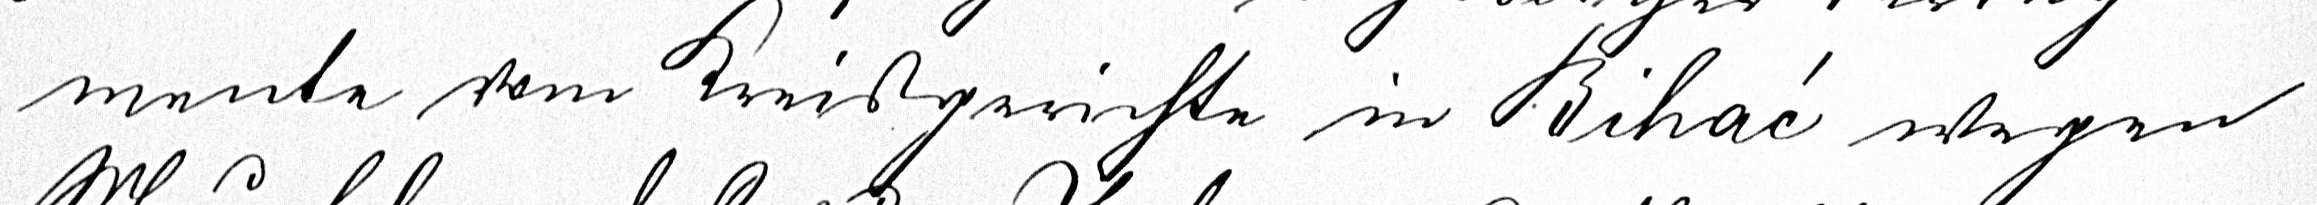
mente vom Kreisgerichte in Bihać wegen
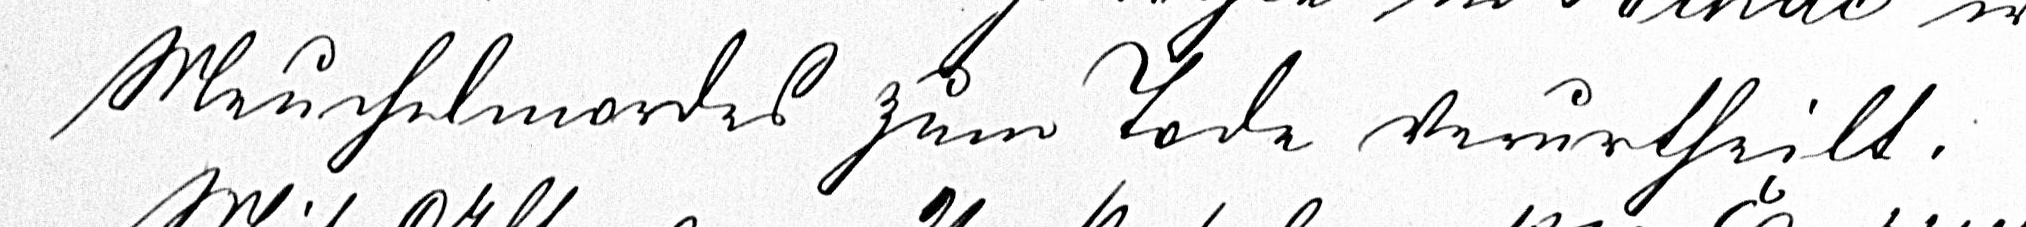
Meuchelmordes zum Tode verurtheilt.
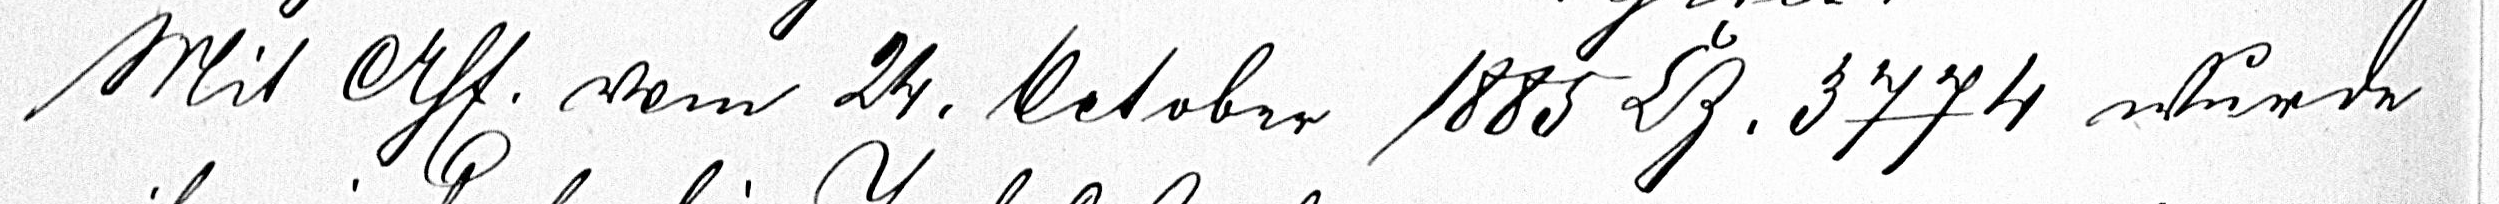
Mit Ahf. vom 24. October 1885 Cz. 3774 wurde
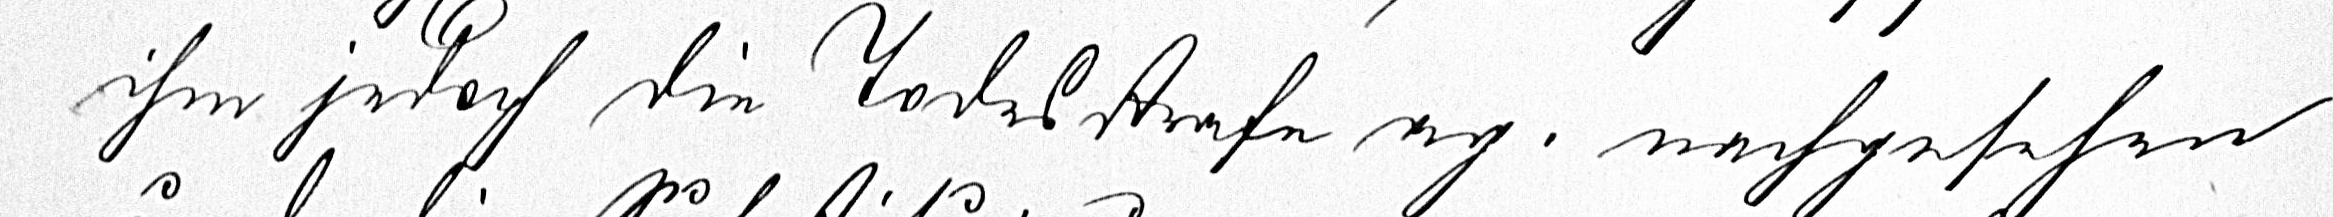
ihm jedoch die Todesstrafe ag. nachgesehen
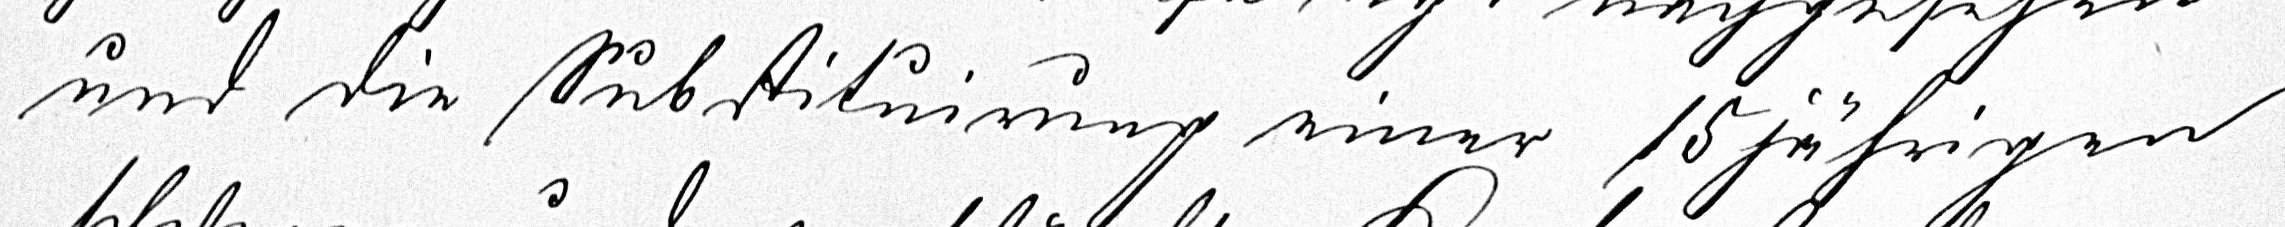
und die Substituierung einer 15 jährigen
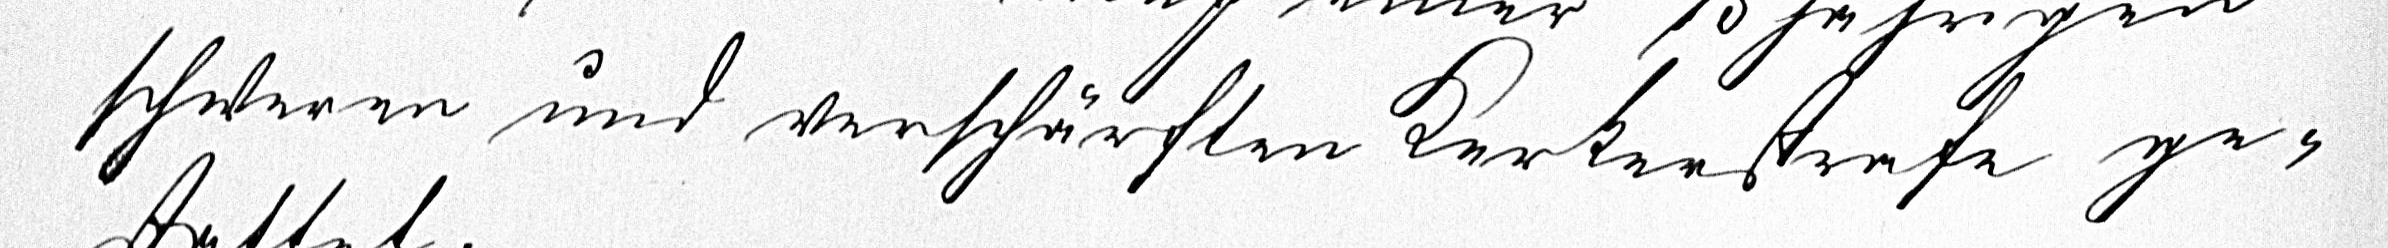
schweren und verschärften Kerkerstrafe ge¬
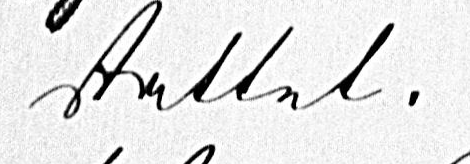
stattet.
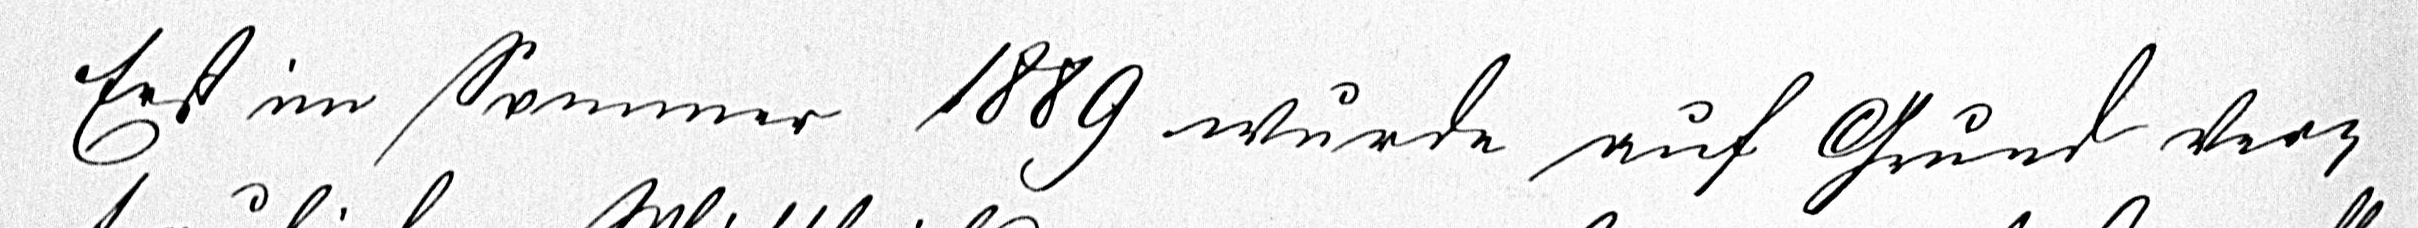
Erst im Sommer 1889 wurde auf Grund ver¬
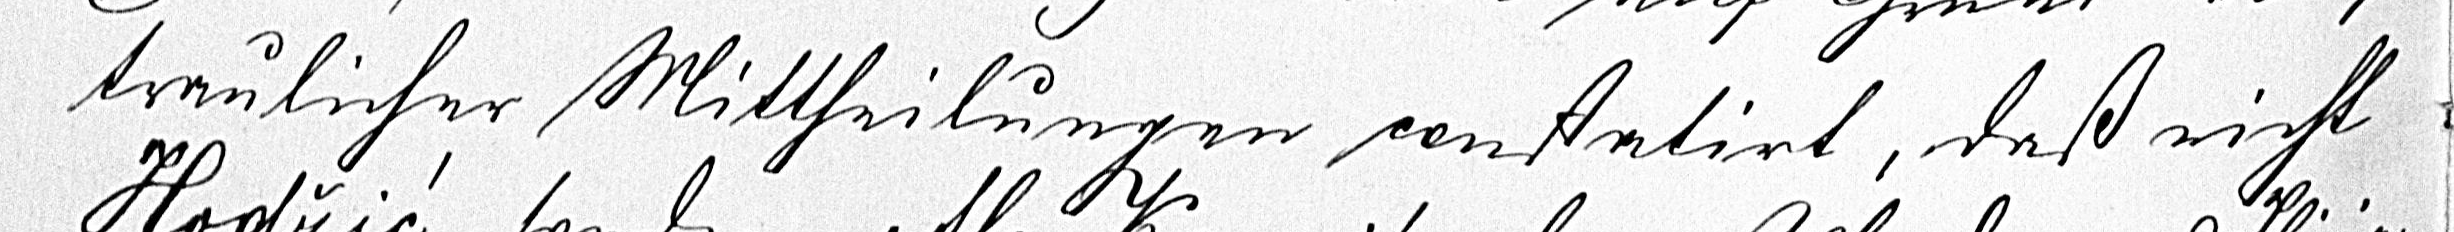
traulicher Mittheilungen censtatirt, daß richt
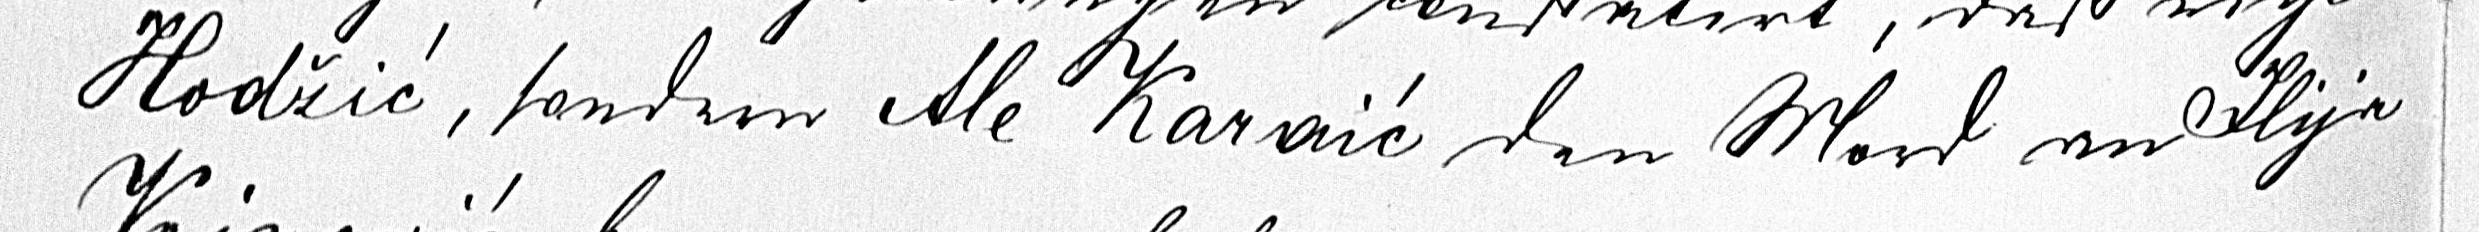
Hodzić, sondern Ale Karvić den Mord en Ilija
